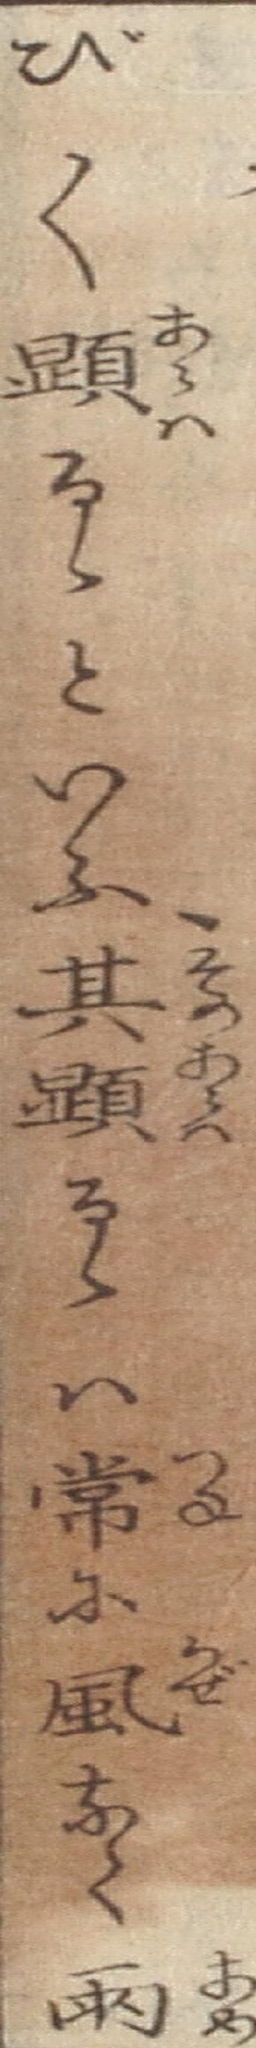び〳〵顕るゝといふ、其顕るゝは常に風なく雨
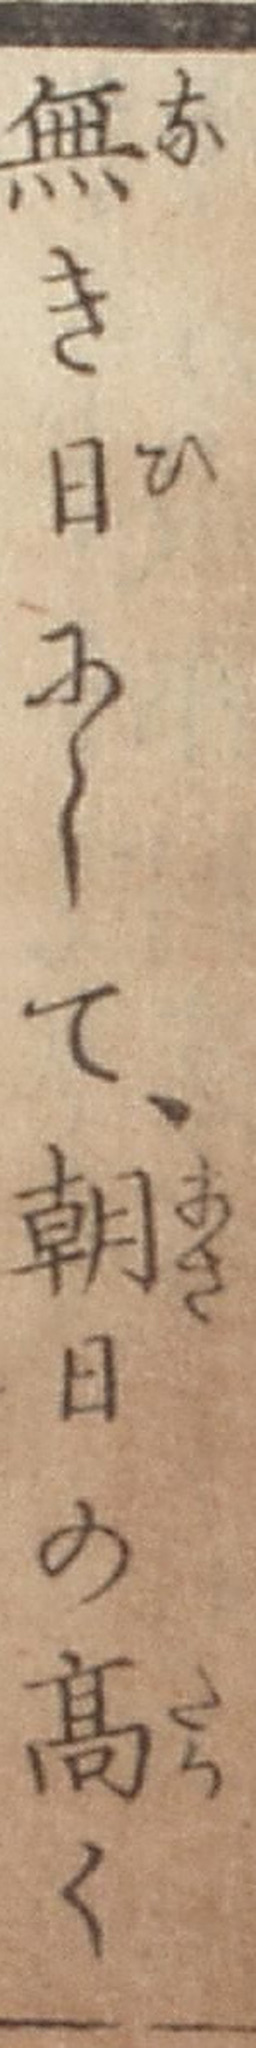無き日にして、朝日の高く
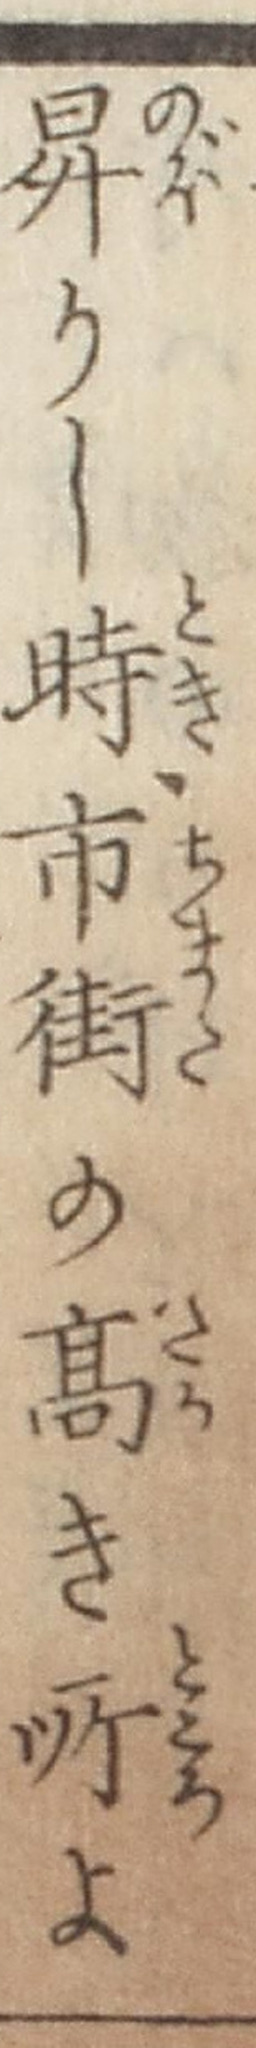昇りし時、市街の高き所よ
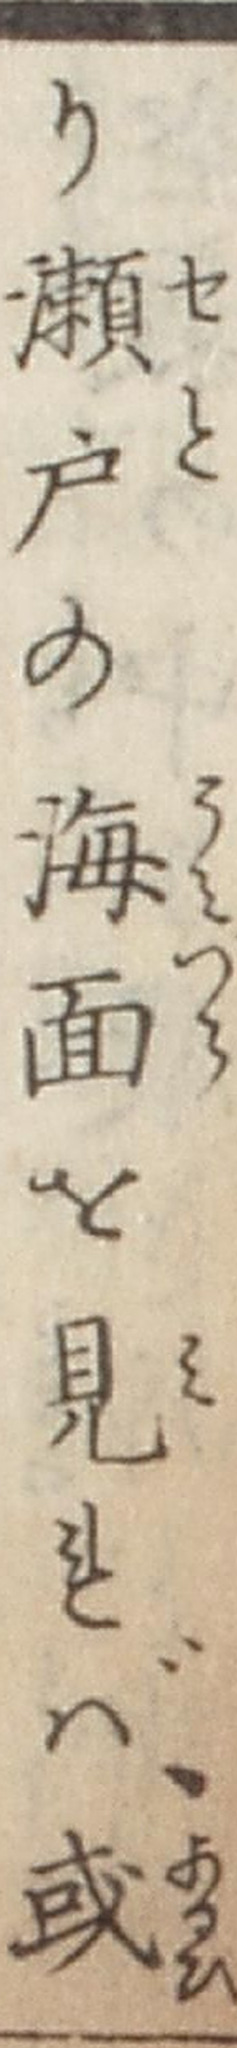り瀬戸の海面を見れば、或
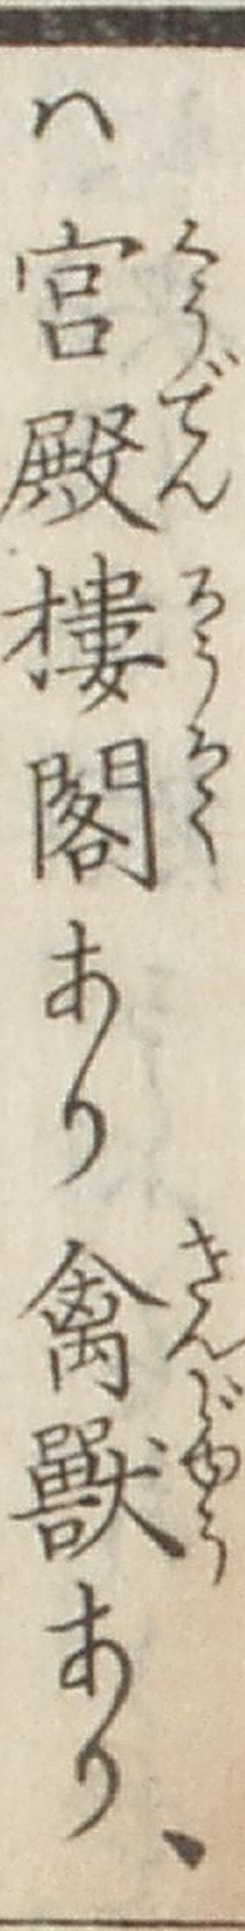は宮殿楼閣あり禽獣あり、
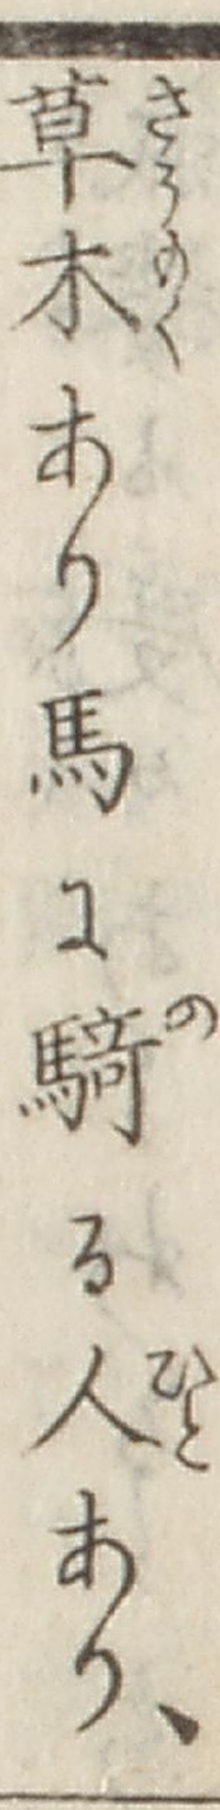草木あり馬に騎る人あり、
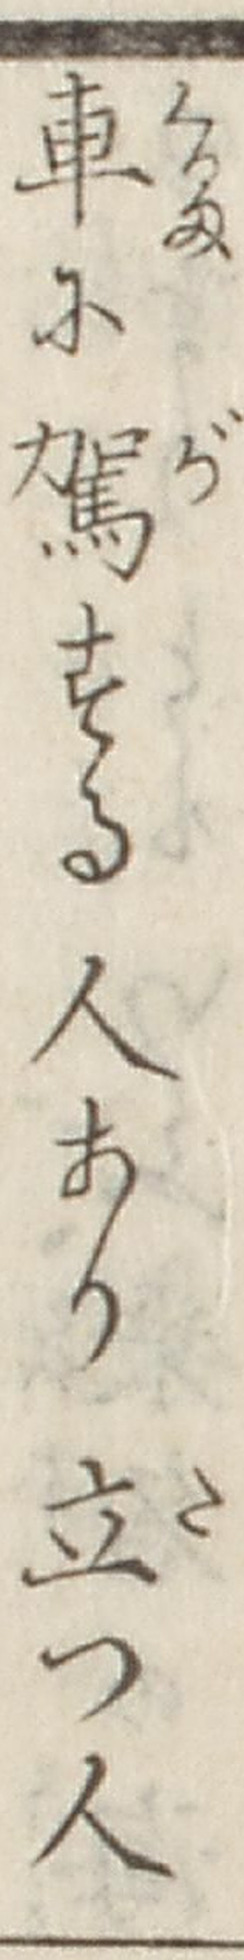車に駕する人あり立つ人
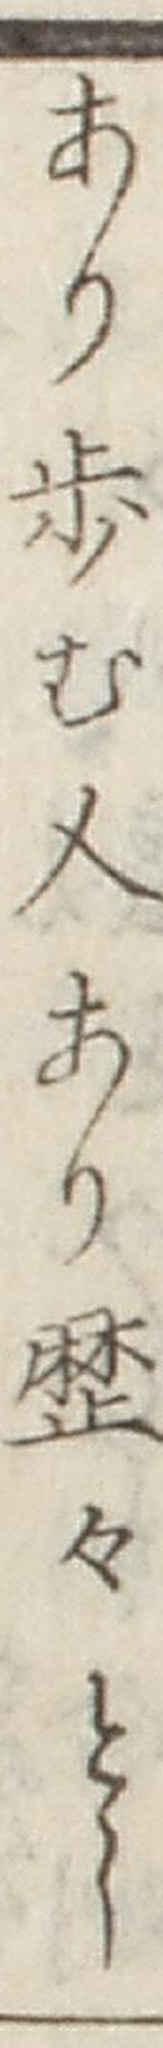あり歩む人あり、歴々とし
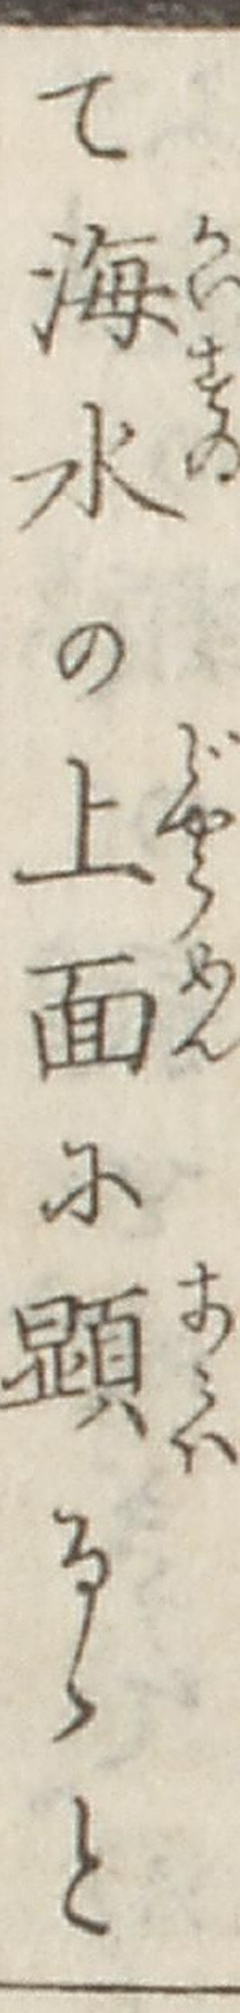て海水の上面に顕るゝと
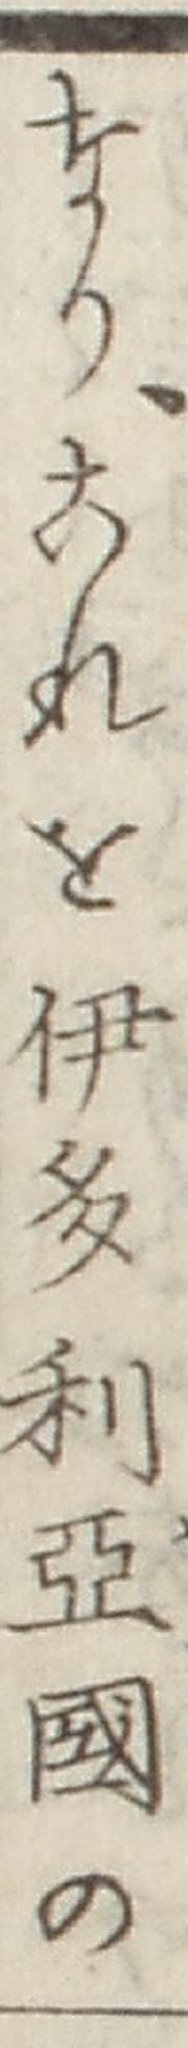なり、これを伊太利亜国の

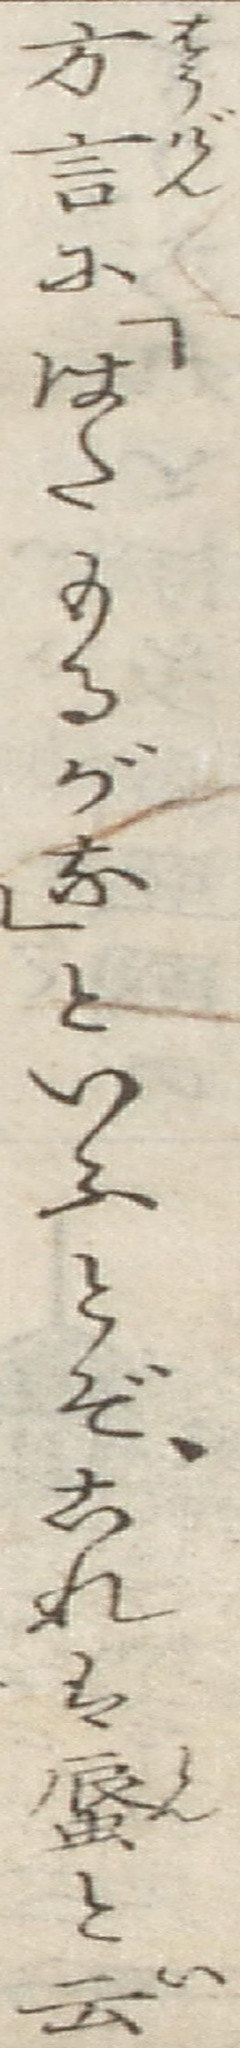方言に「はたもるがな」といふとぞ、これは蜃と云
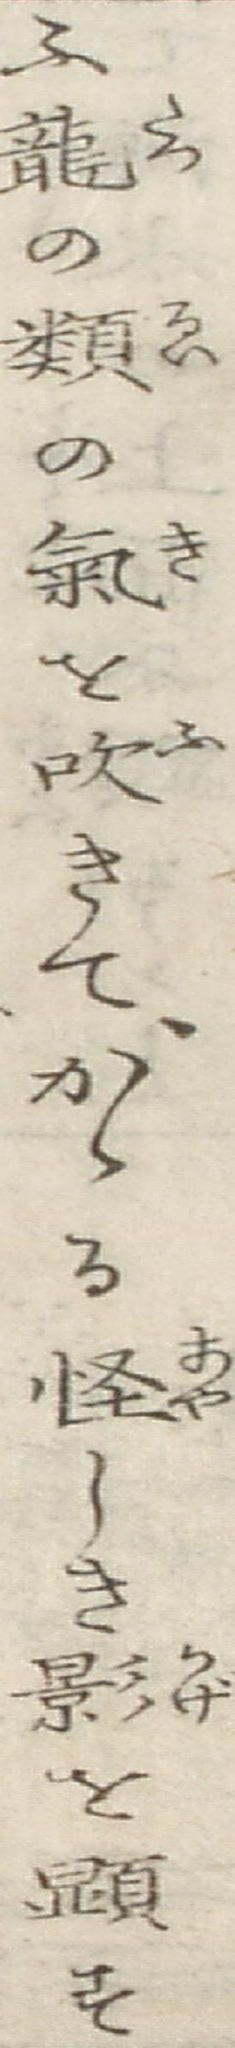ふ龍の類の気を吹きて、かゝる怪しき影を顕す
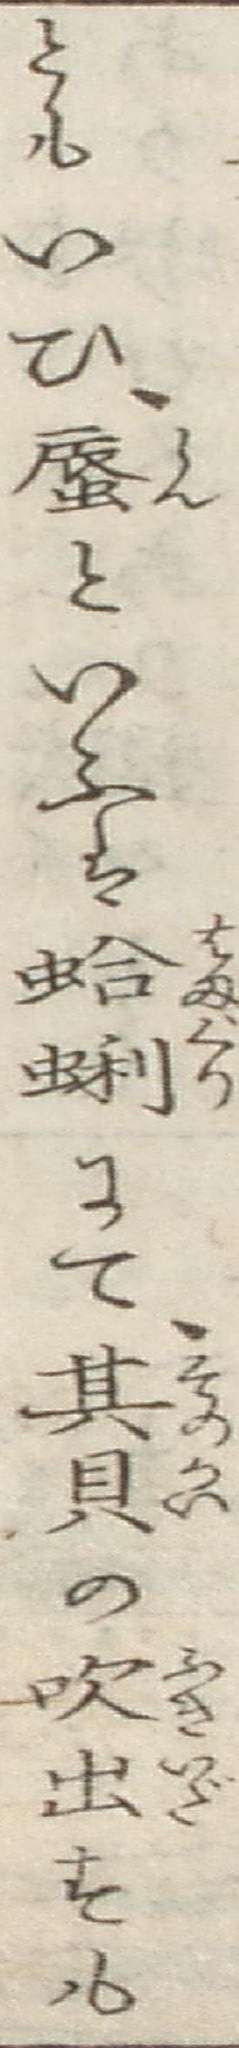ともいひ、蜃といふは蛤蜊にて、其貝の吹出すも
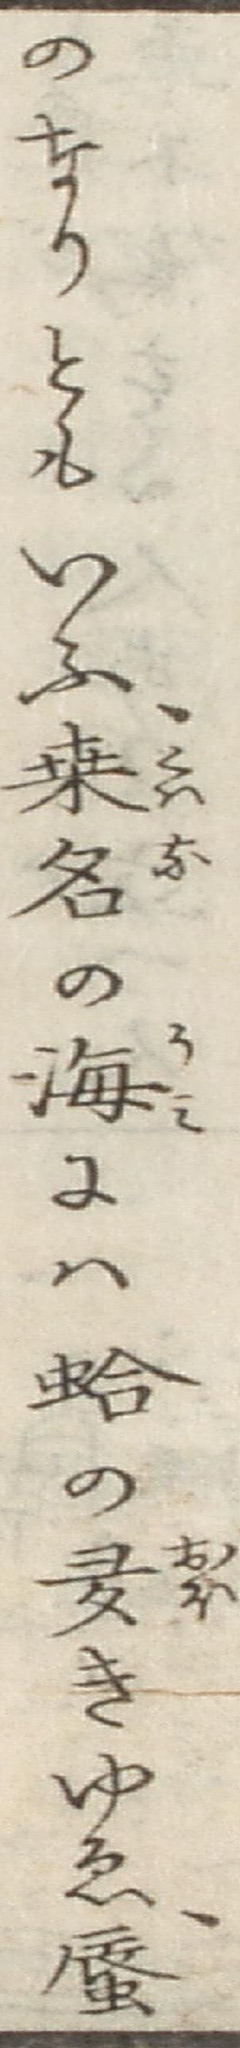のなりともいふ、桑名の海には蛤の多きゆゑ、蜃
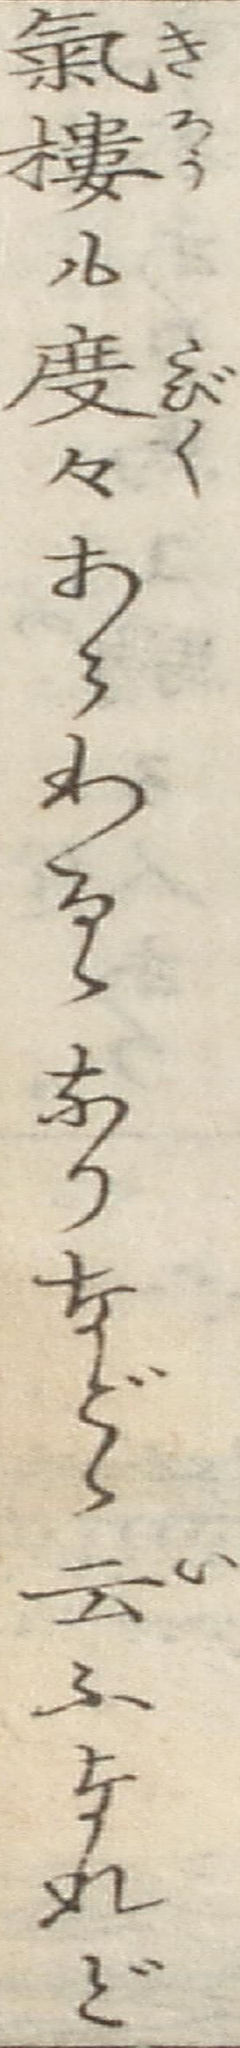気楼も度々あらわるゝなりなどゝ云ふなれど
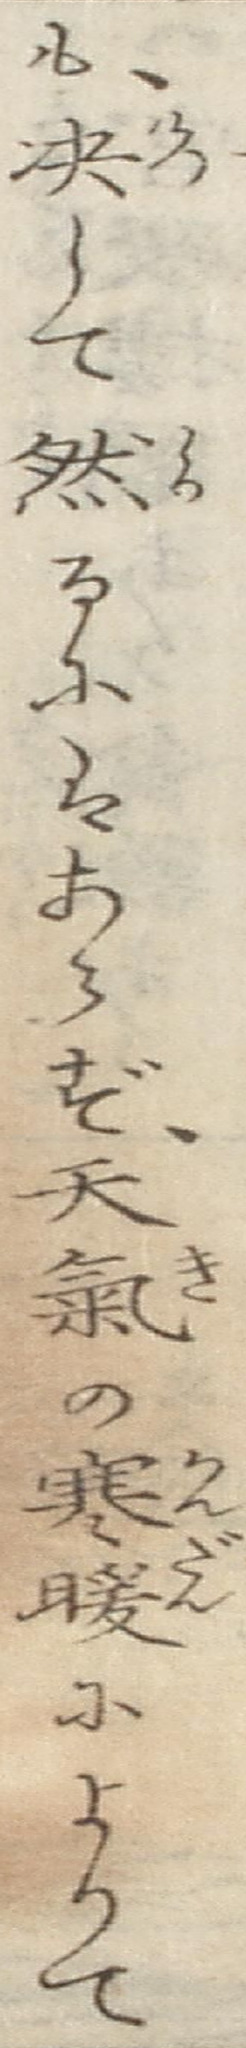も、決して然るにはあらず、天気の寒暖によりて
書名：変異辯　一名、天變地異拾遺　全
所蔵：東京大学地震研究所図書室 Earthquake Research Institute Library, The University of Tokyo, JAPAN
